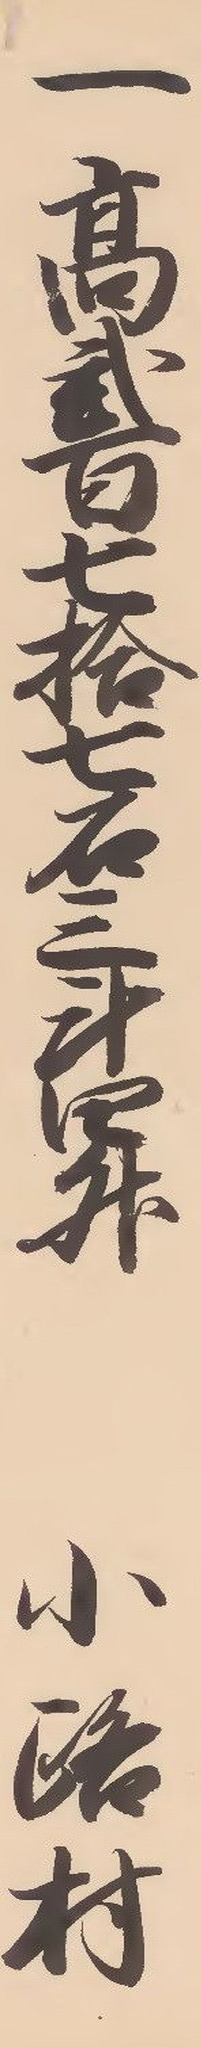一高弐百七拾七石三斗四升小路村
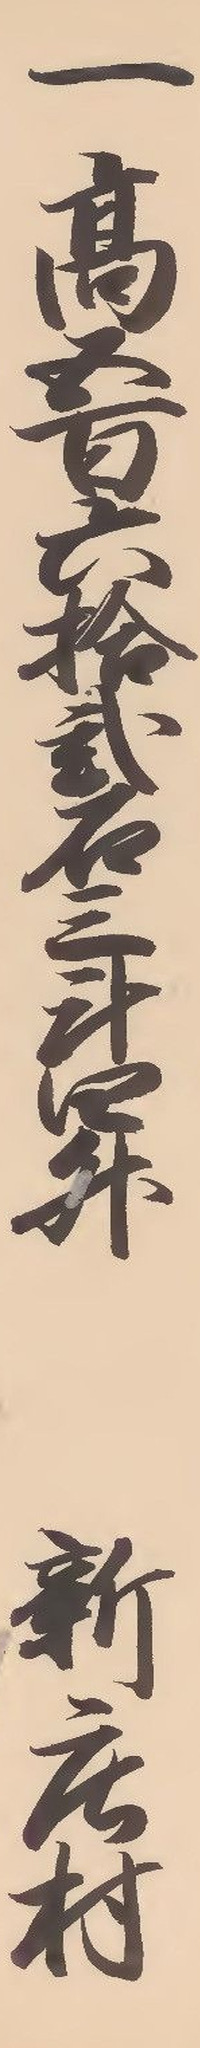一高五百六拾弐石三斗四升新庄村
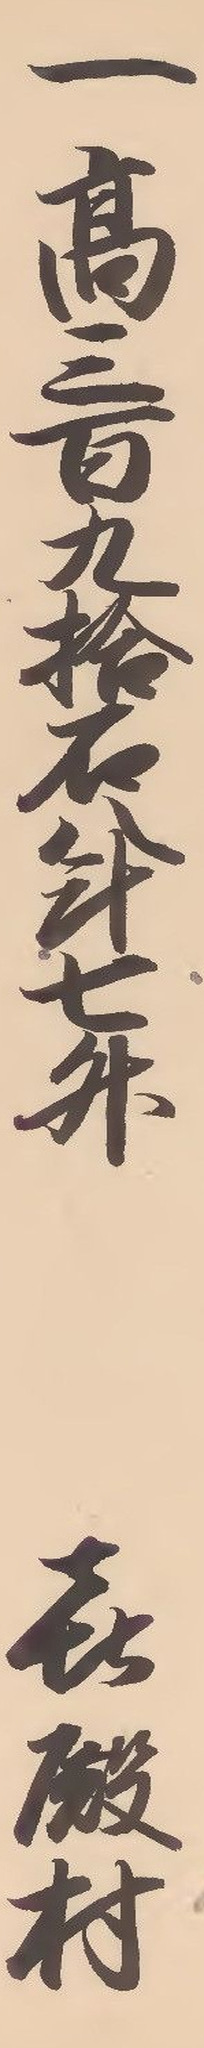一高三百九拾石八斗七升喜殿村

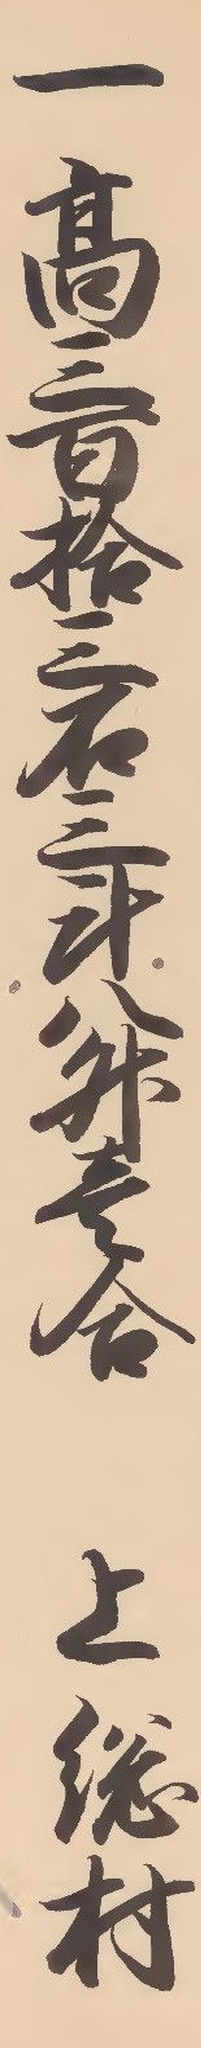一高三百拾三石三斗八升壱合上総村
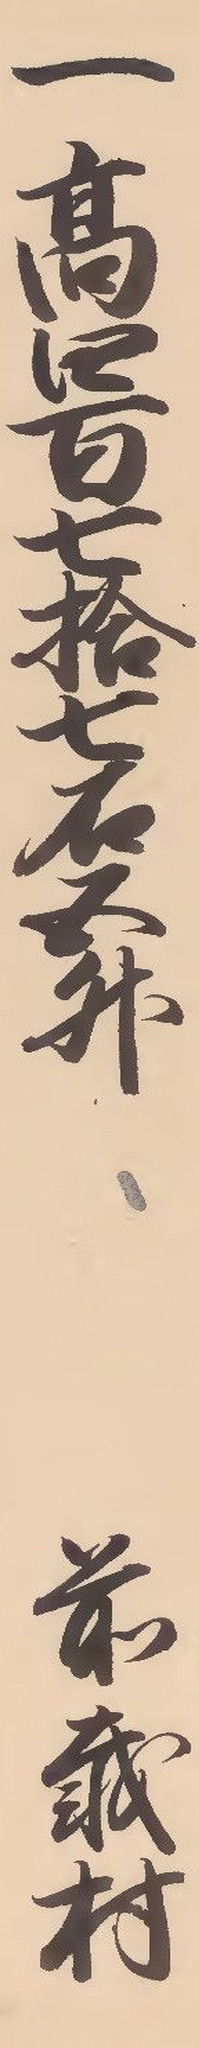一高四百七拾七石五升前載村
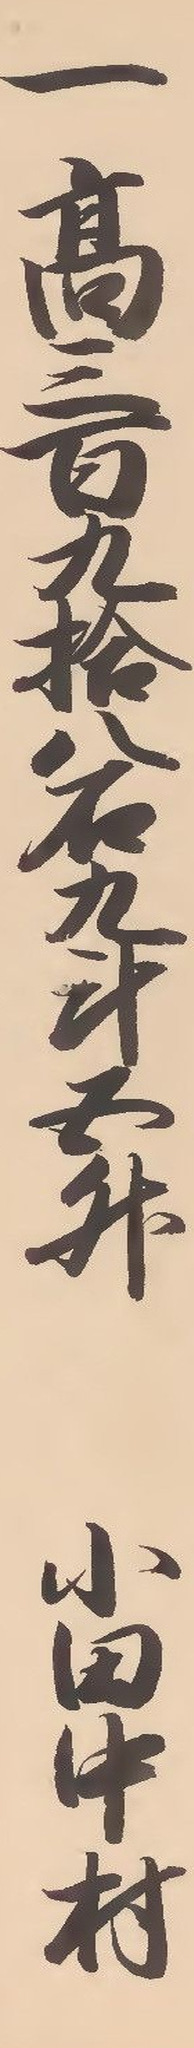一高三百九拾八石九斗五升小田中村
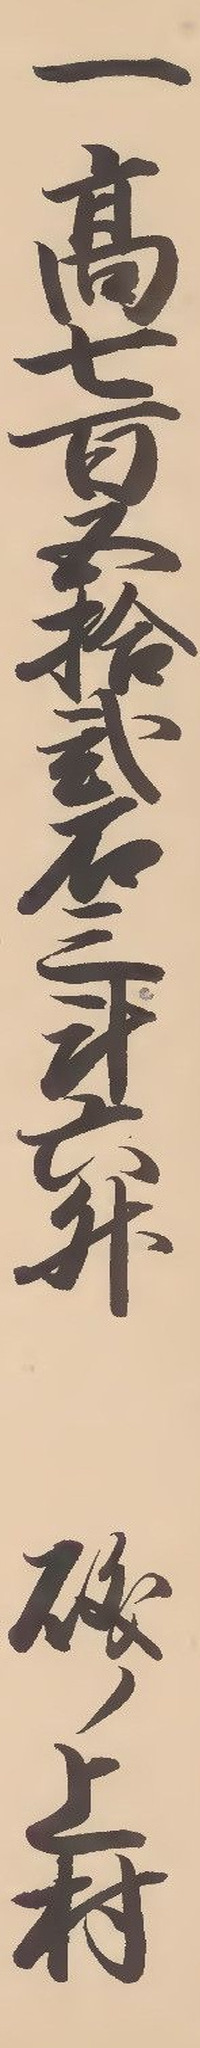一高七百五拾弐石三斗六升磯ノ上村
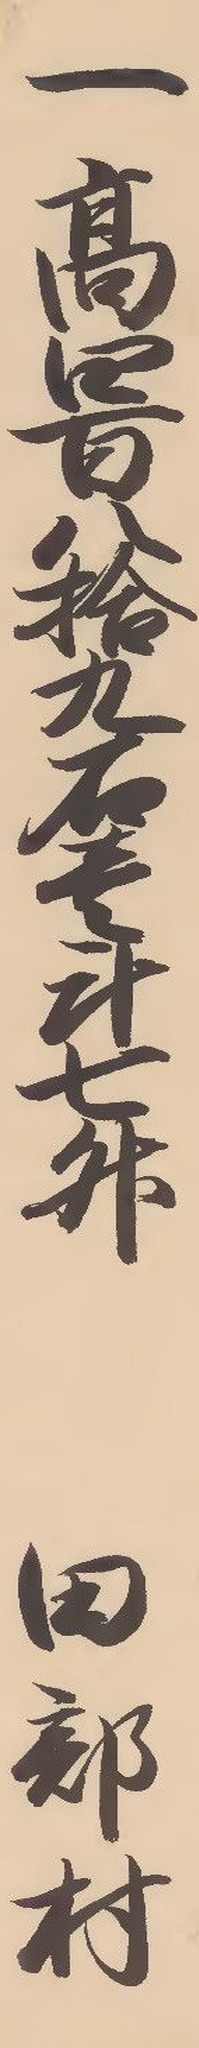一高四百八拾九石壱斗七升田部村
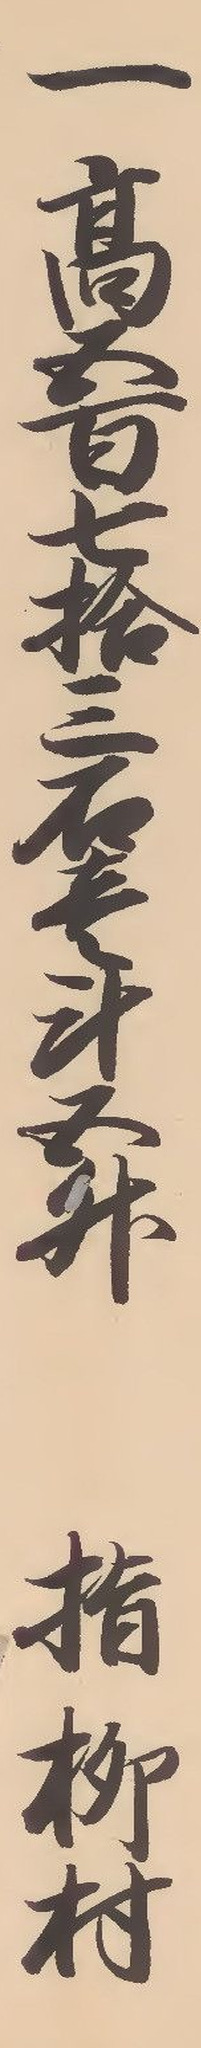一高五百七拾三石壱斗五升指柳村
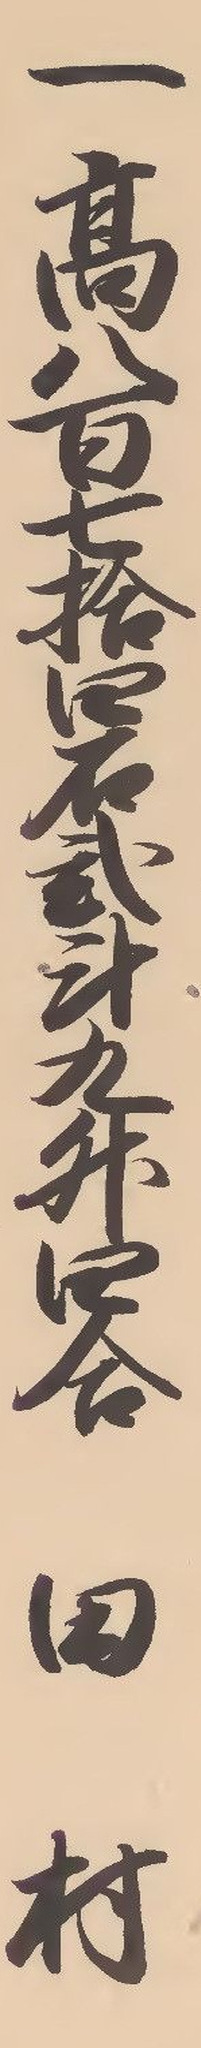一高八百七拾四石弐斗九升四合田村

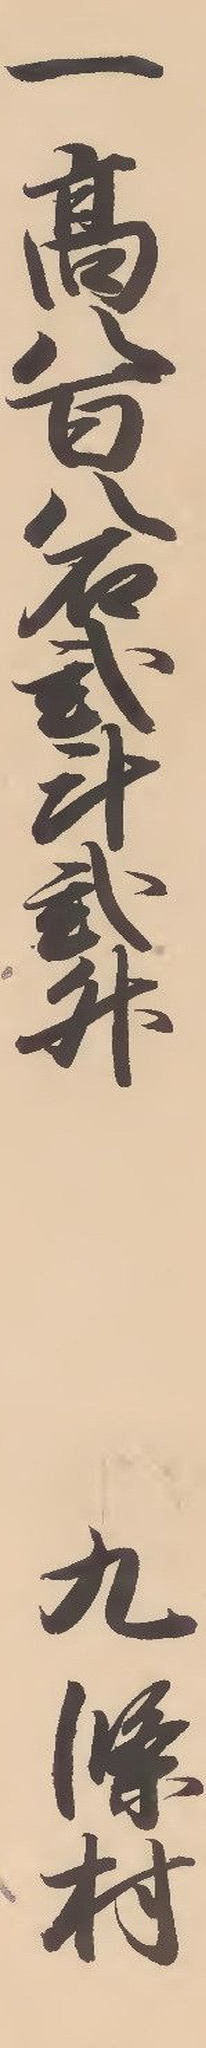一高八百八石弐斗弐升九条村
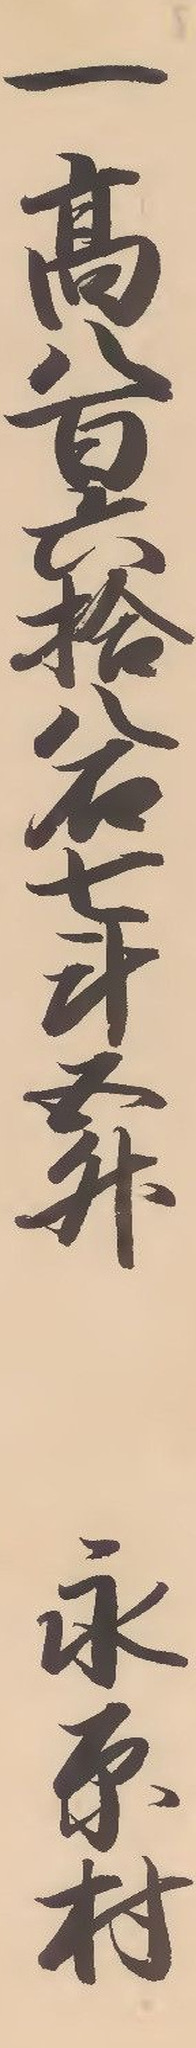一高八百六拾八石七斗五升永原村
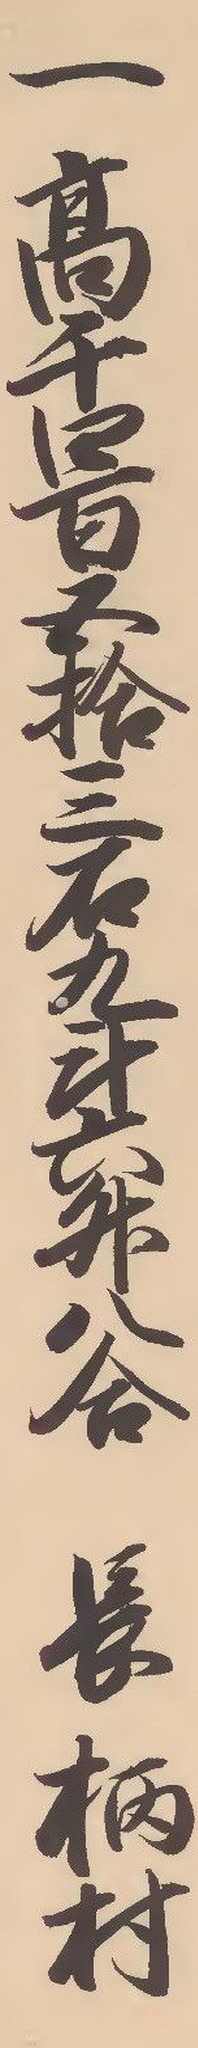一高千四百五拾三石九斗六升八合長柄村
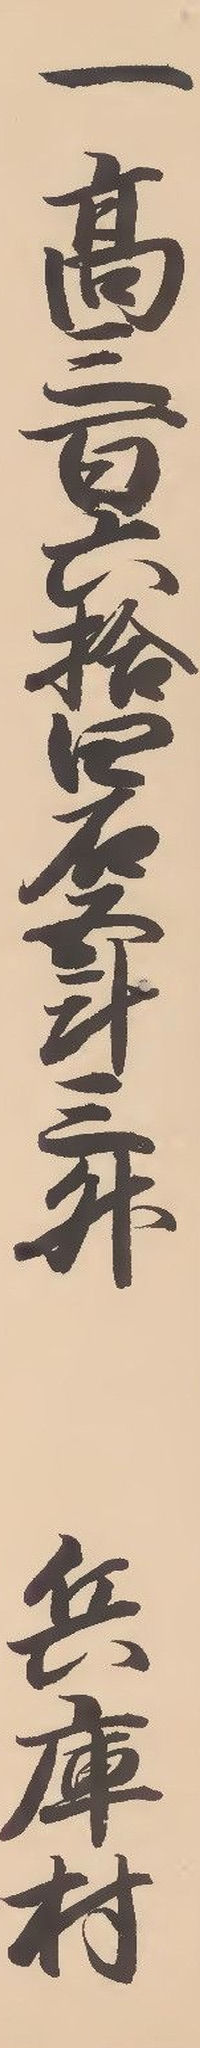一高三百六拾四石五斗三升兵庫村
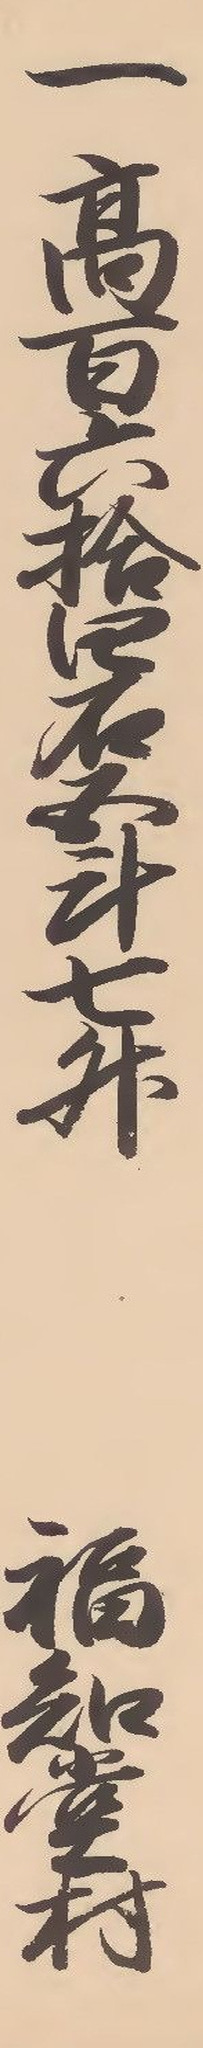一高百六拾四石五斗七升福知堂村
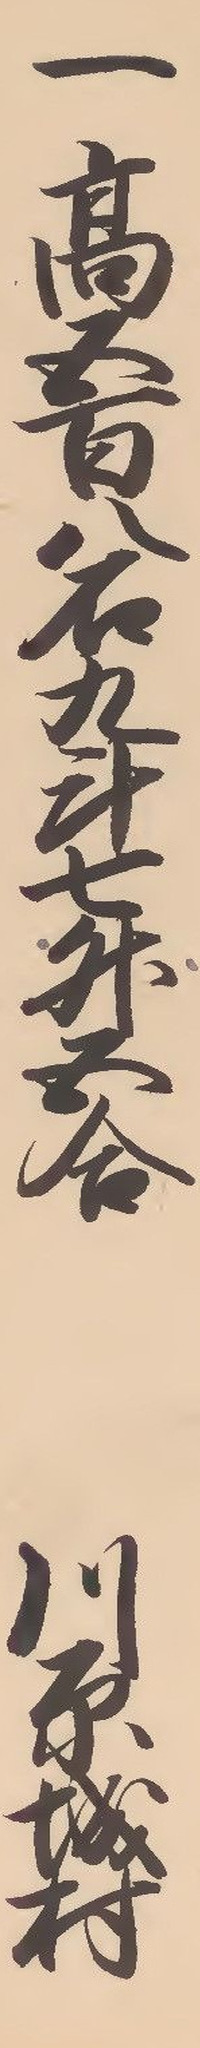一高五百八石九斗七升五合川原城村
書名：大和国郷帳
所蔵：国立公文書館 National Archives of Japan
